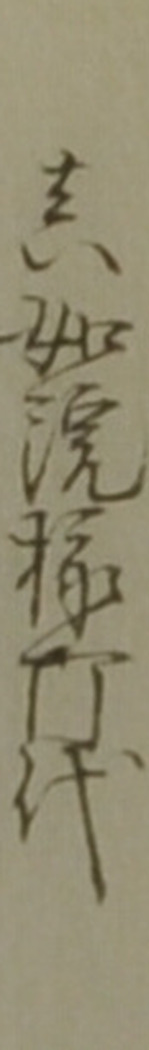真如院様御代
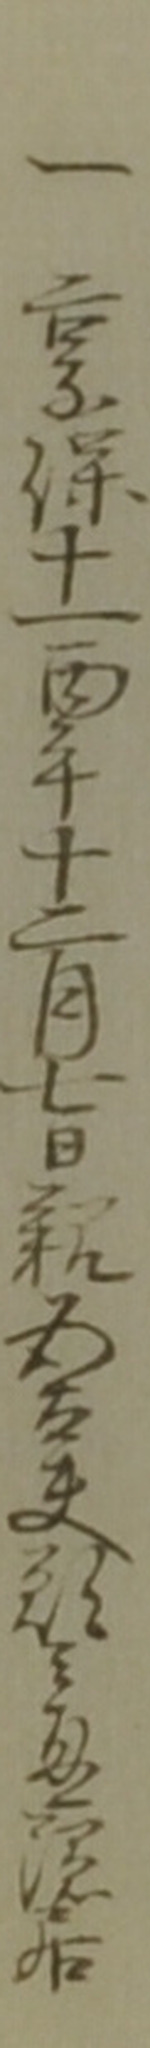一享保十一丙午十二月七日親五太夫願之通隠居
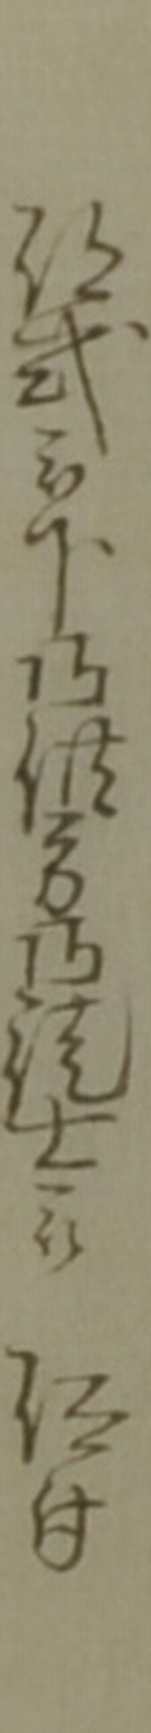跡式被下御供方御徒士被仰付
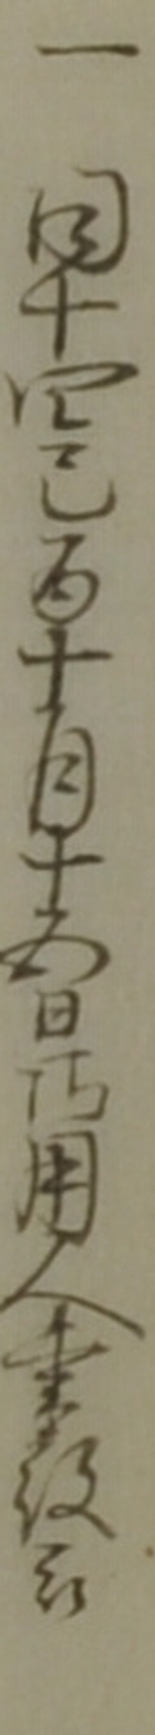一同十四己酉十月十五日御用人書役被
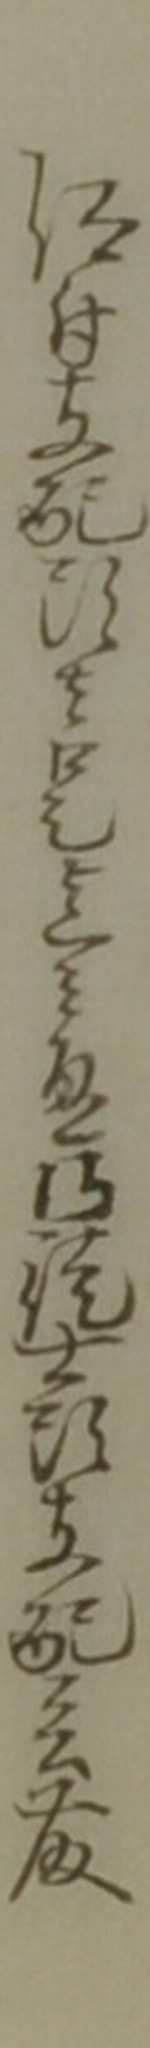仰付支配頭者是迄之通御徒士頭支配玄藤
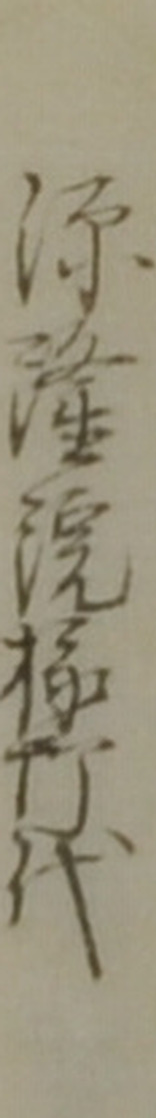源隆院様御代
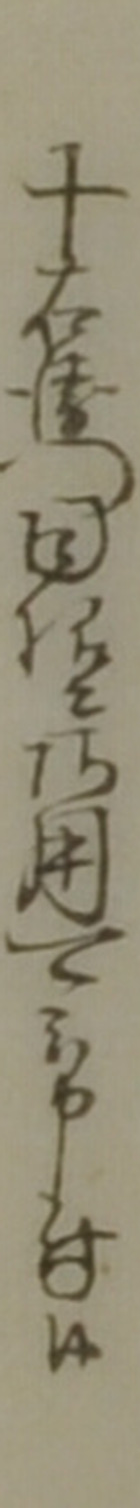十右衛門同様ニ御用可被申付候
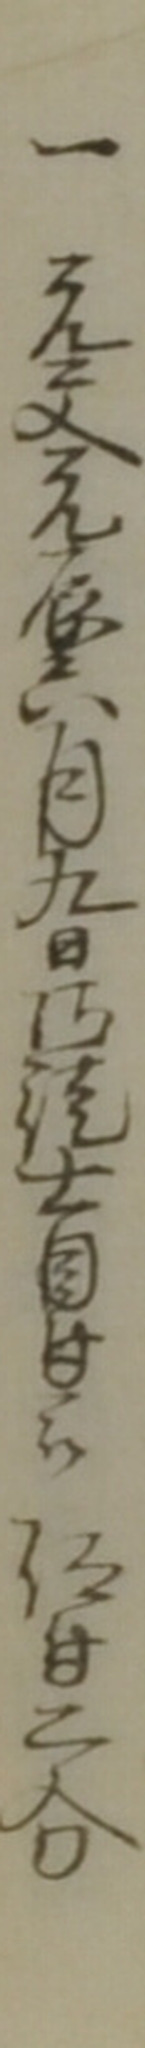一元文元辰六月九日御徒士目付被仰付二分
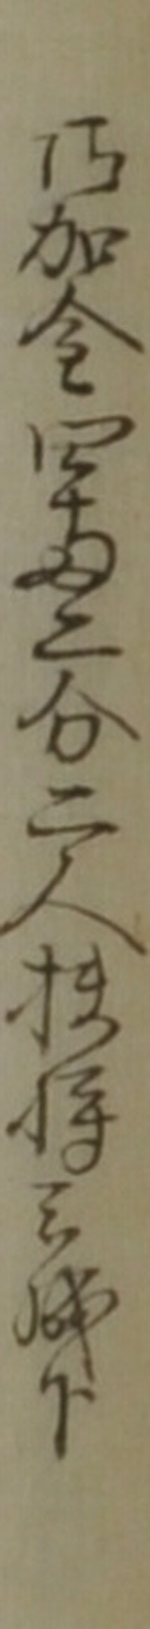御加金四両二分二人扶持被成下
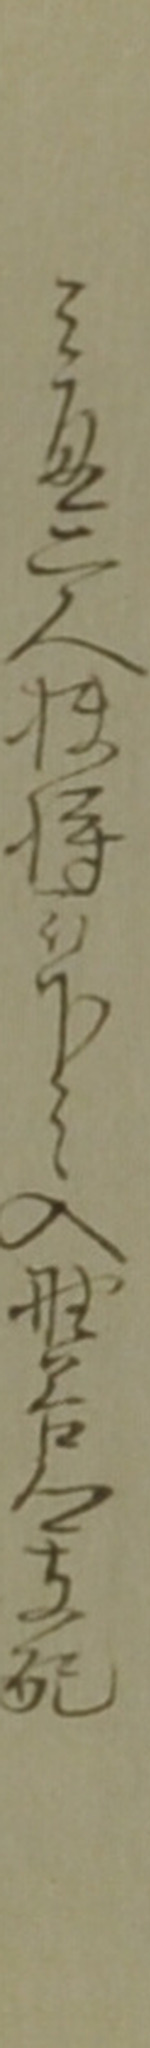之通二人扶持被下之入野谷郷支配
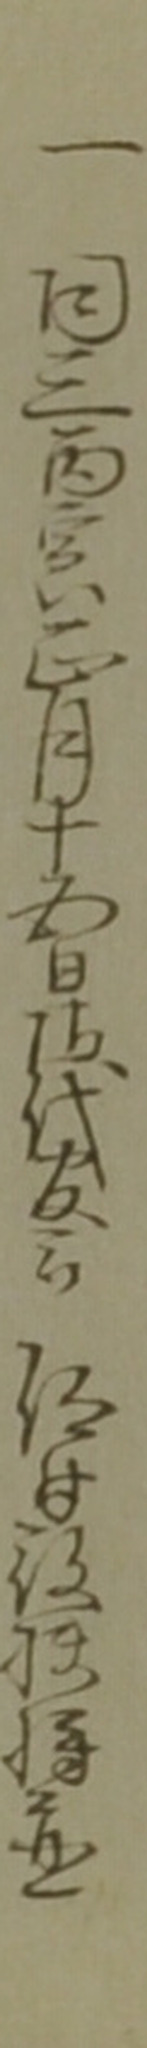一同三丙寅正月十五日御代官被仰付役扶持並
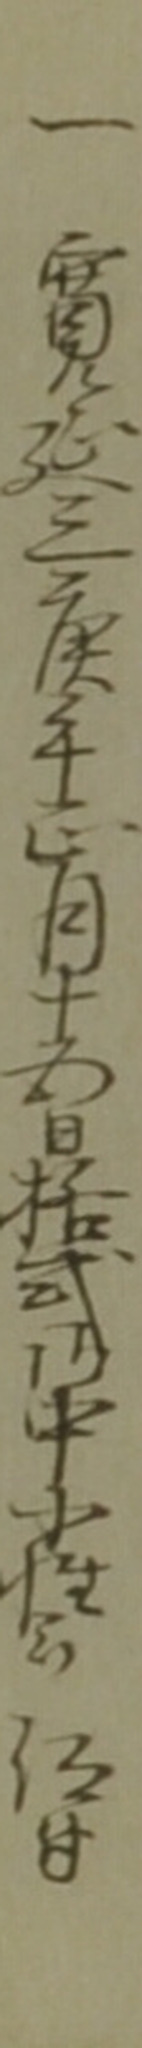一寛延三庚午正月十五日格式尾御中小性被仰付
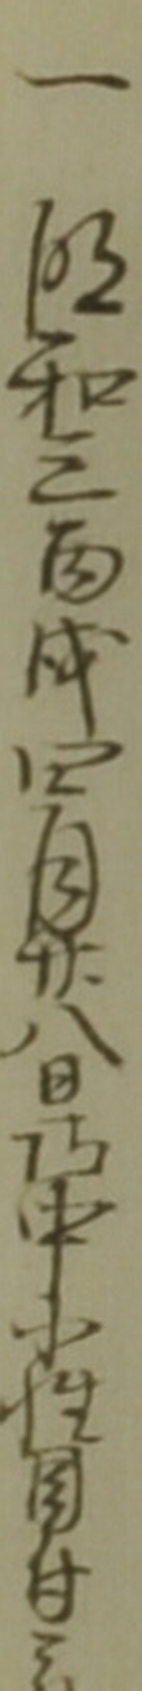一明和三丙戌四月廿八日御中小性目付被
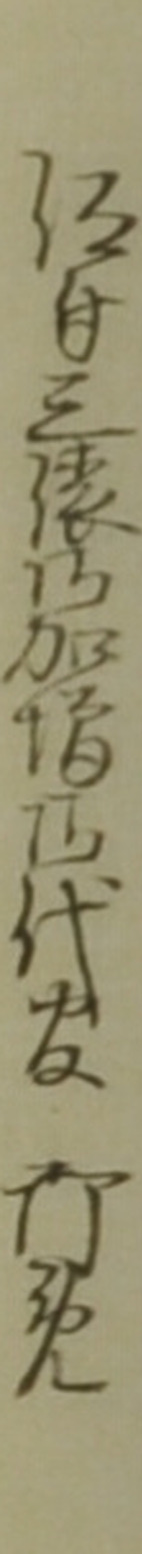仰付三俵御加増御代官御免

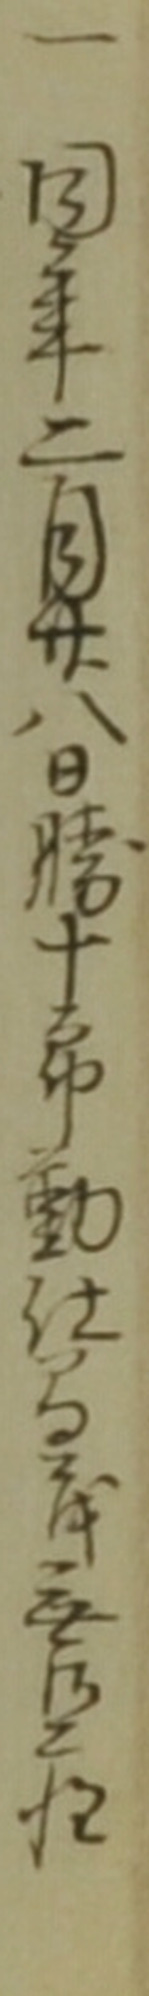一同年二月廿八日勝十郎勤仕間茂無御座
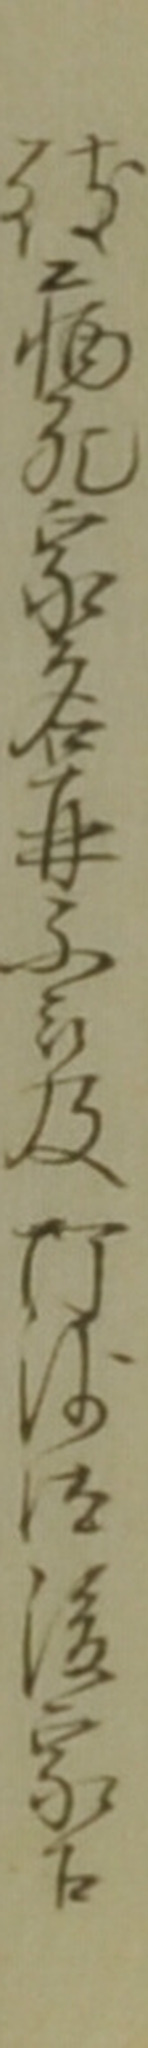致病死家名再不被及御沙汰後家江
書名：無足廃家（壱）
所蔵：伊那市立高遠町図書館・合同会社AMANE
